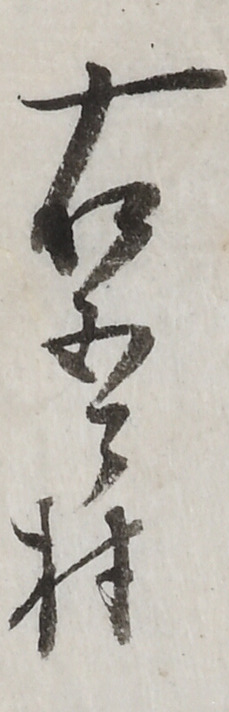右五ヶ村
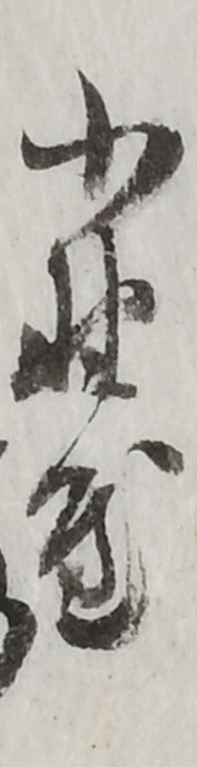小野屋
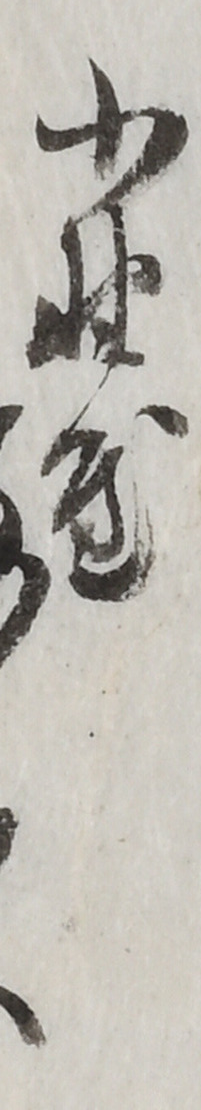小野屋

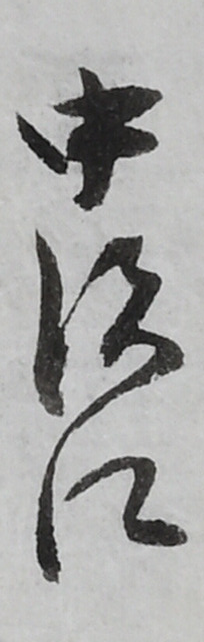中沢郷
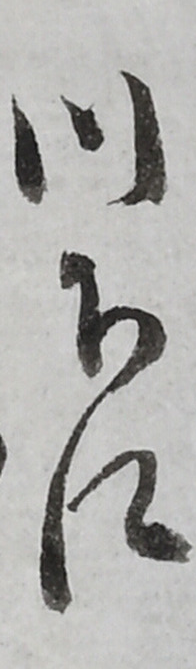川下郷
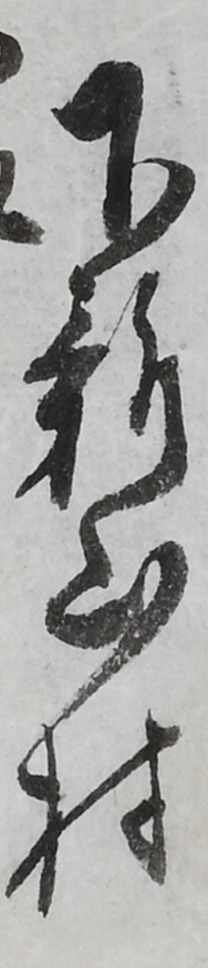下新山村
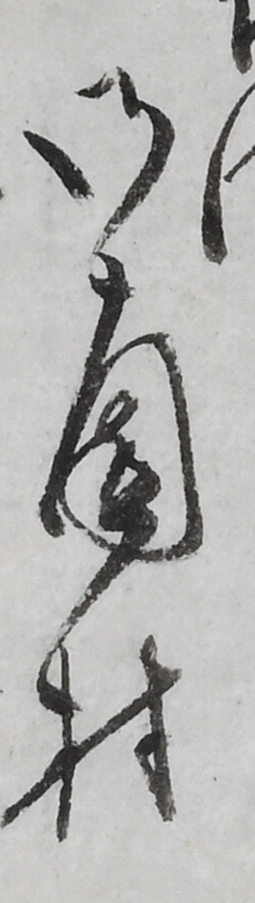御園村
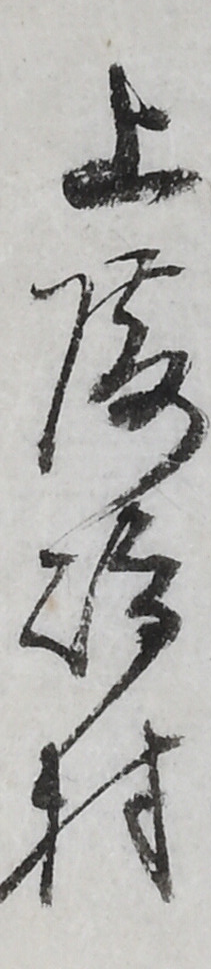上殿嶋村
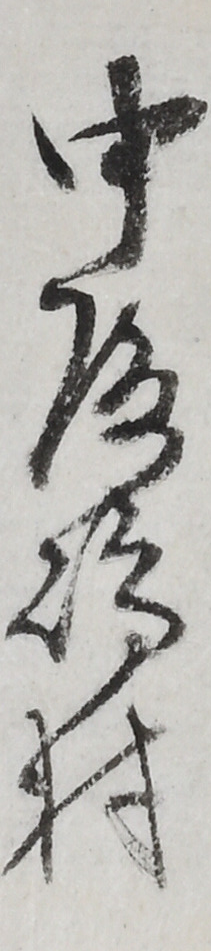中殿嶋村
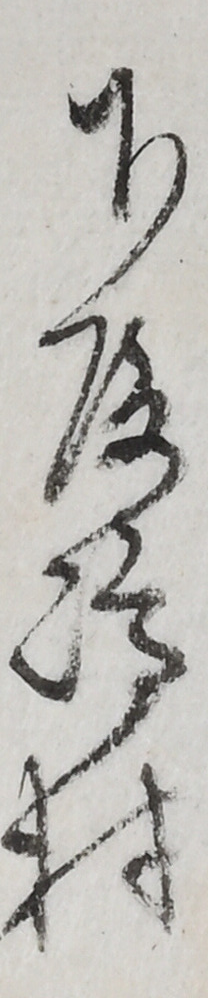下殿嶋村
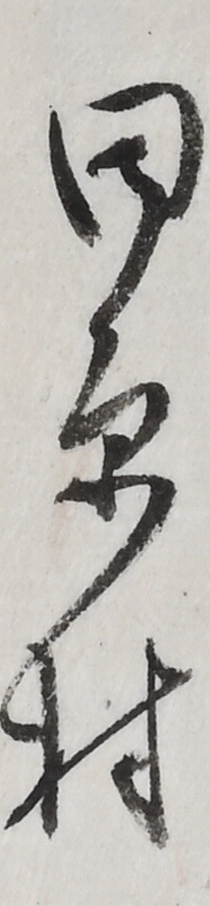田原村
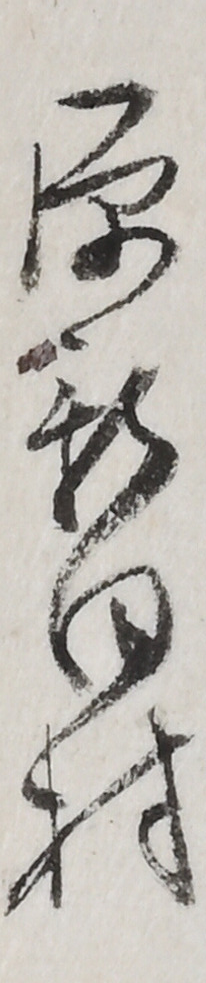原新田村
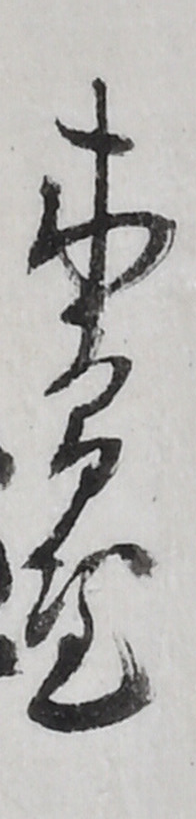木曽屋
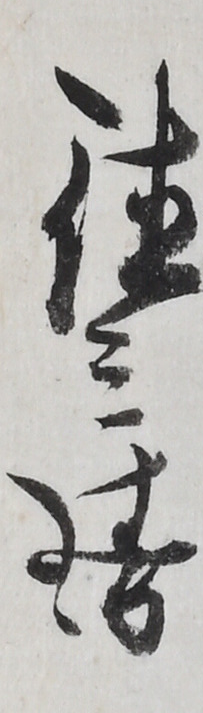徳兵衛
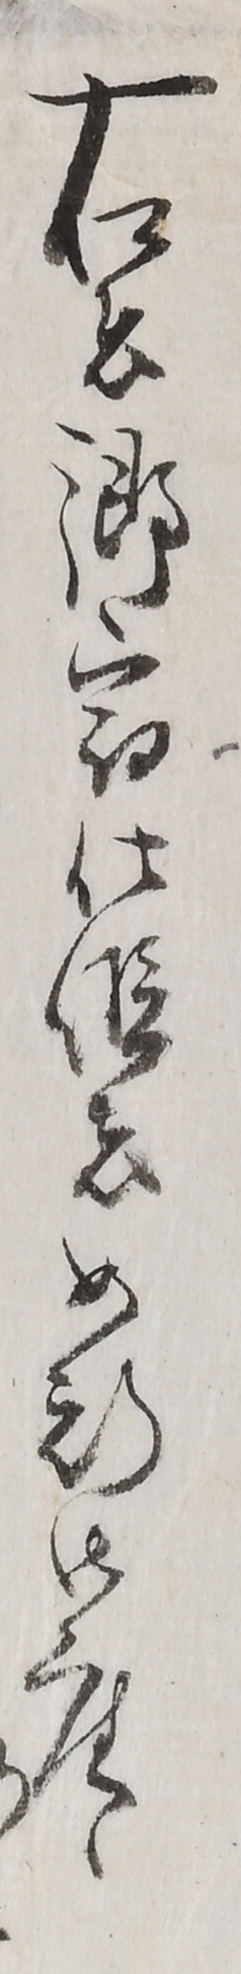右は御宿仕候は如斯御座候
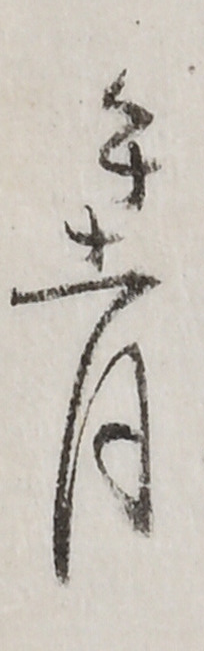午十一月
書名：年内行事帳
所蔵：伊那市立高遠町図書館・合同会社AMANE
